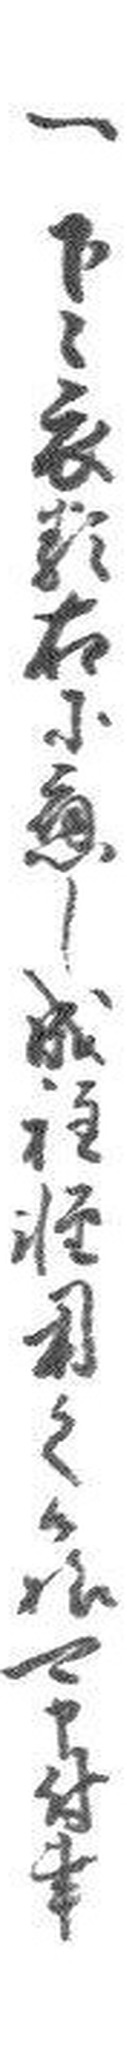一下々衣類右に応し成程軽用之候様可申付事
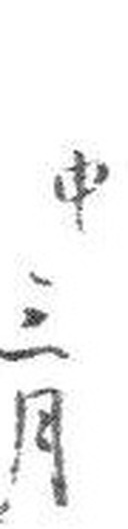申三月
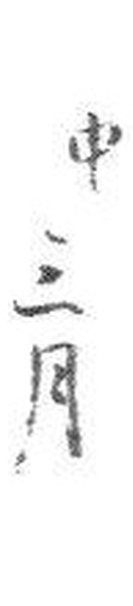申三月
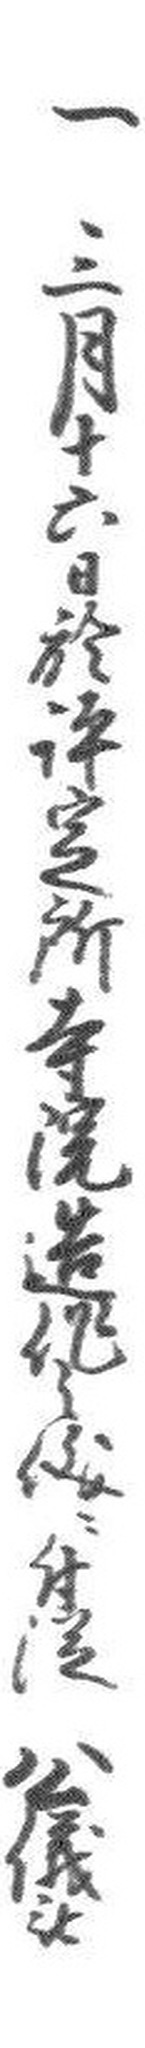一三月十六日於評定所寺院造作之儀ニ付従公儀被
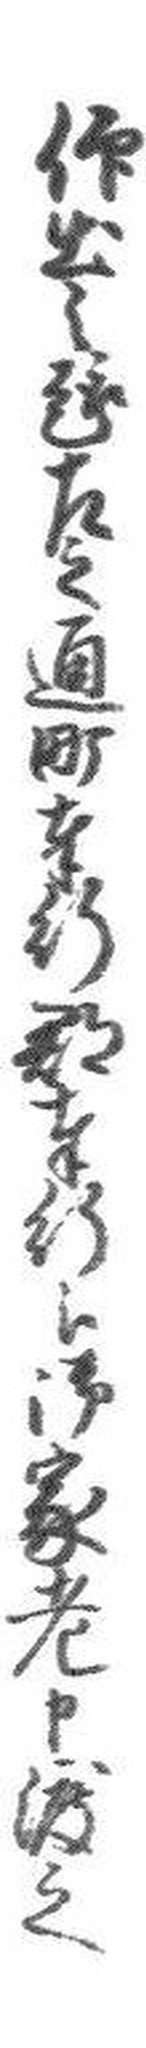仰出之趣左之通町奉行郡奉行江御家老申渡之
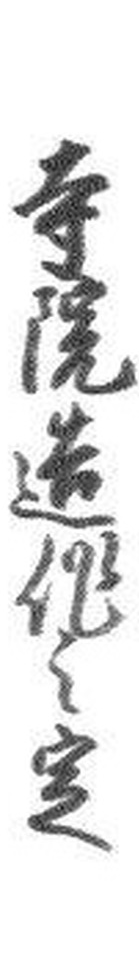寺院造作之定
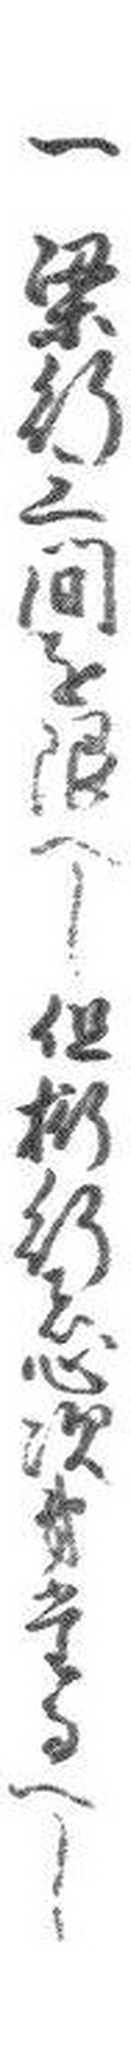一梁行三間を限へし但桁行者心次第たるへし
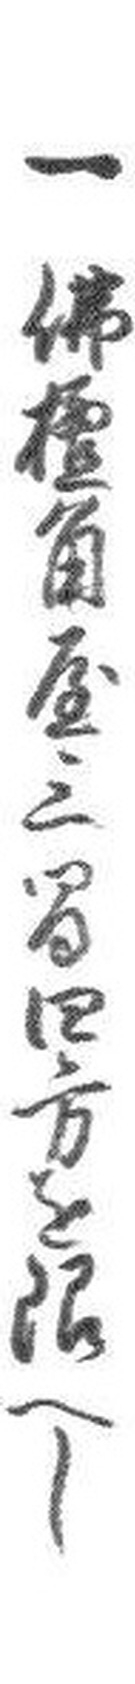一仏壇角屋三間四方を限へし
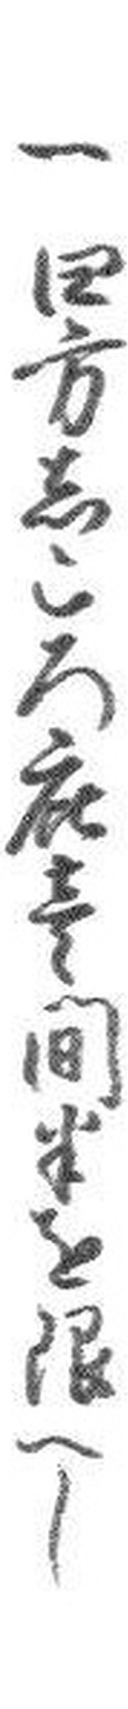一四方しころ庇壱間半を限へし

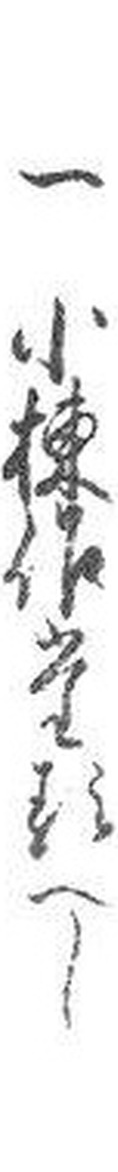一小棟作たるへし
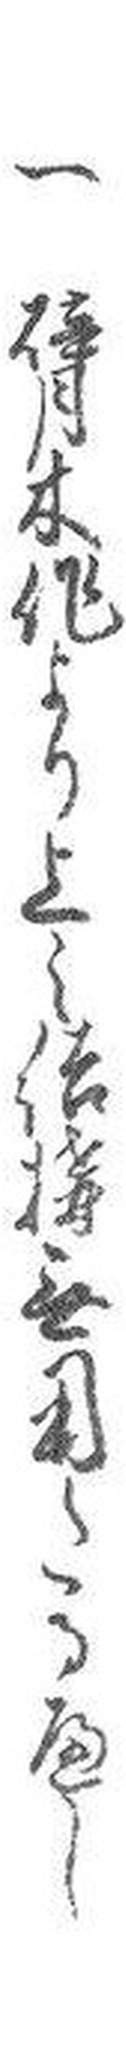一臂木作より上之結構無用たるへし
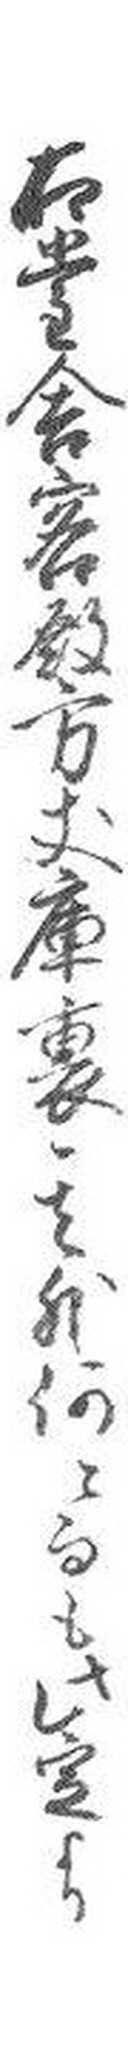右堂舎客殿方丈庫裏其外何ニ而も此定より
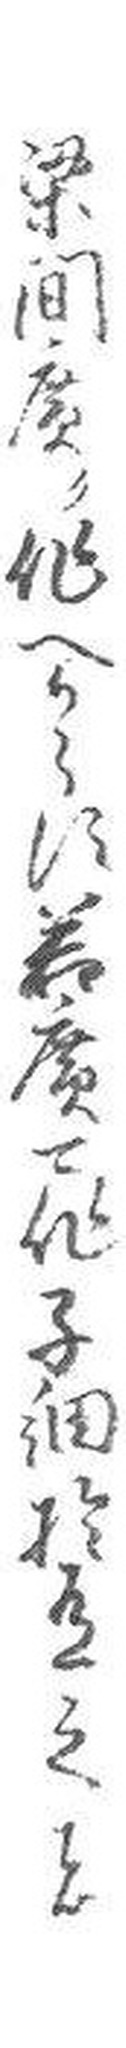梁間広く作へからす若広可作子細於有之者
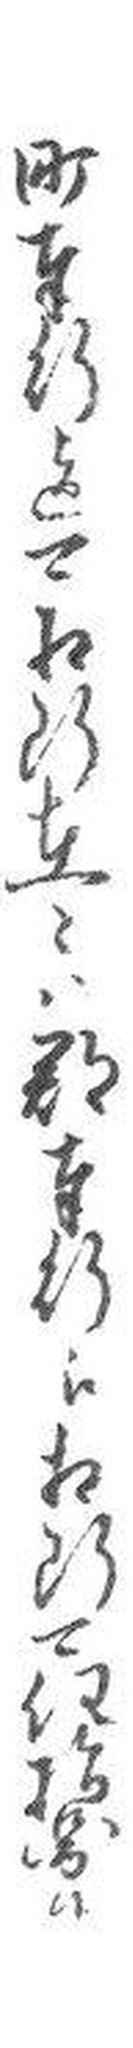町奉行迄可相断在々ハ郡奉行江相断可任指図候
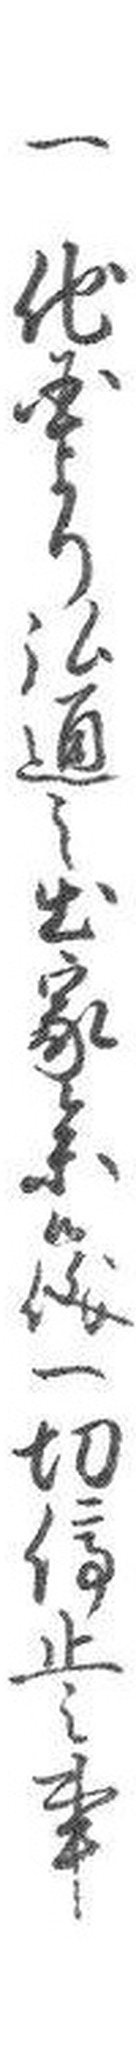一他国より弘通之出家参候儀一切停止之事
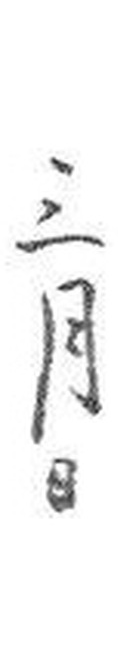三月日
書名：家譜 七 光通公 従寛文四年到同九年
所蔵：福井県文書館 Fukui Prefectural Archives
